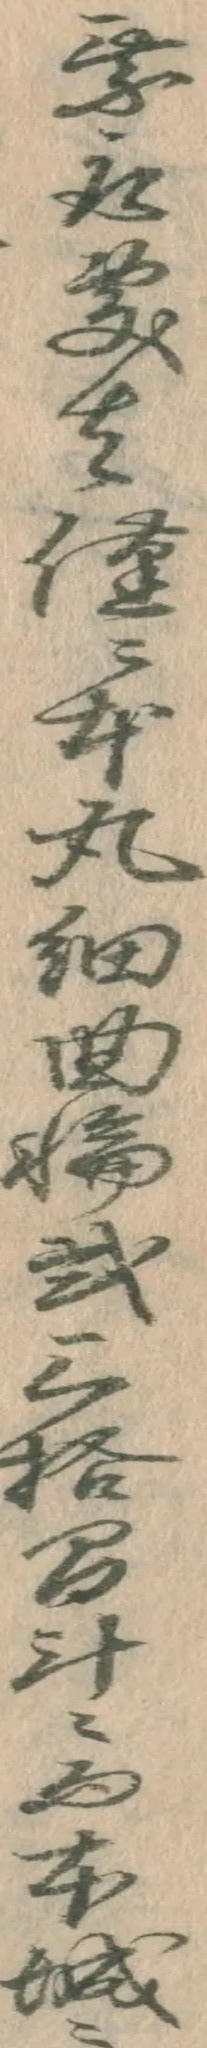乗取處者僅に本丸細曲輪弐三拾間斗に而本城に
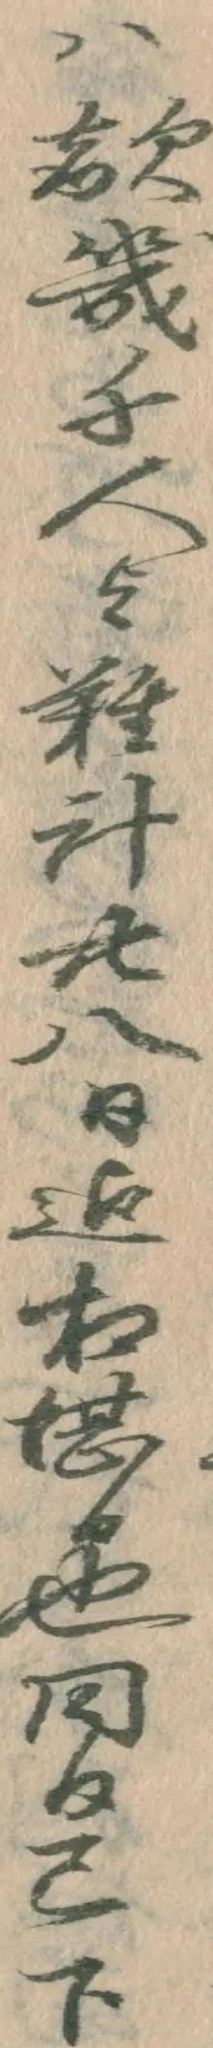は敵幾千人与難斗廿八日迄相堪る也同日巳下
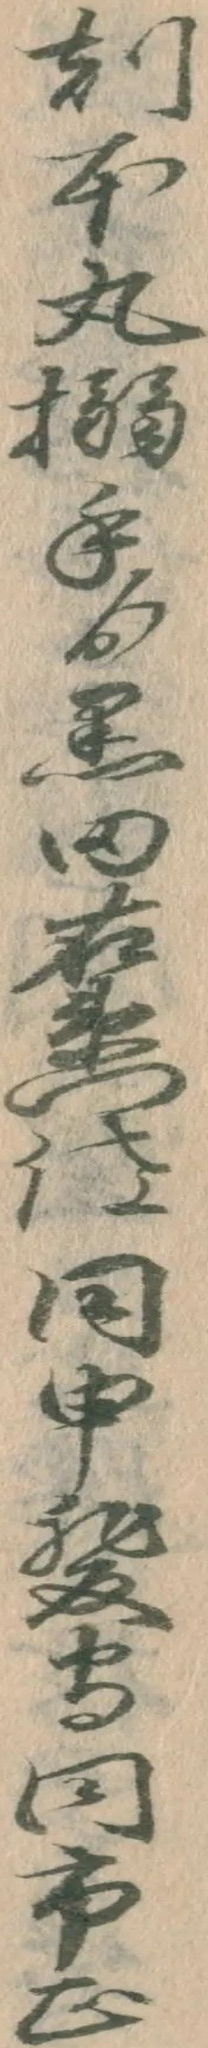刻本丸搦手ゟ黒田右衛門佐同甲斐守同市正
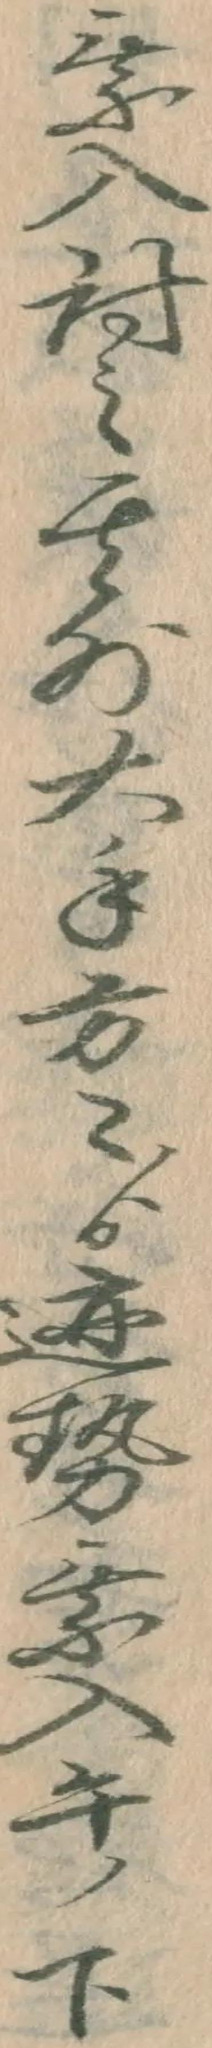乗入討之其外大手方々ゟ迹勢乗入午之下
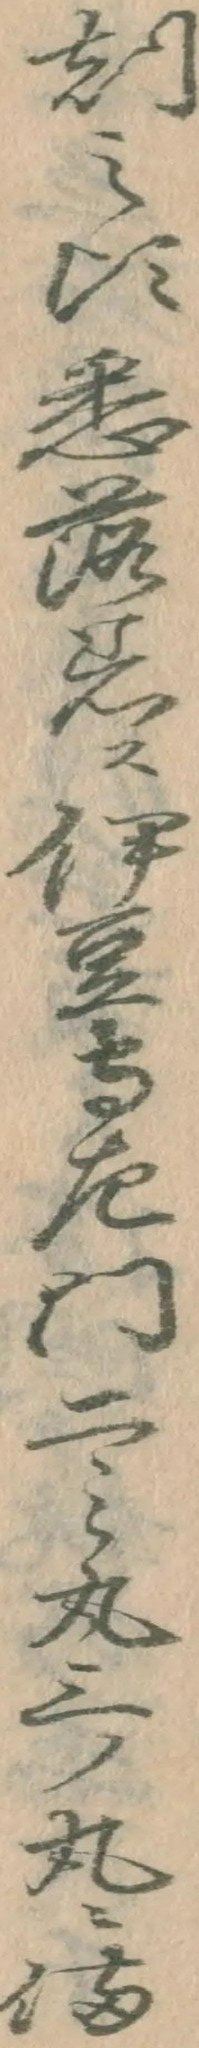刻之頃悉落着す伊豆守左門二之丸三之丸に備

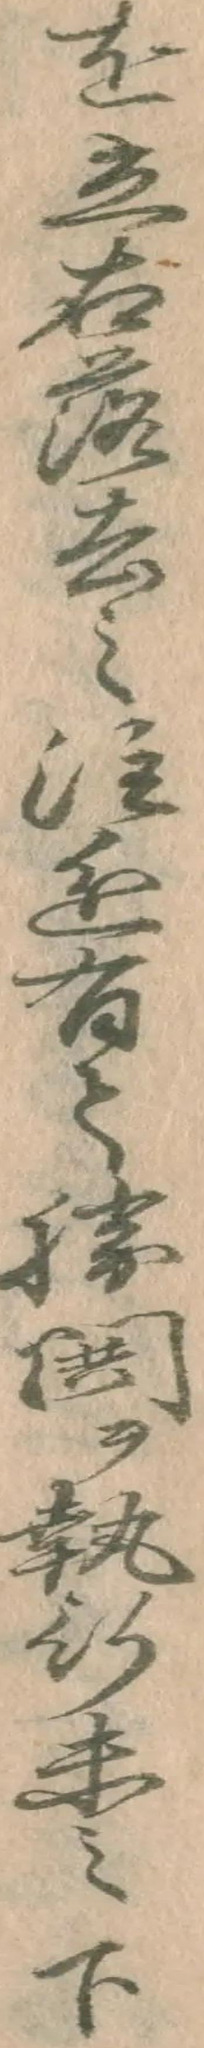を立右落去之注進有て勝鬨を執行未之下
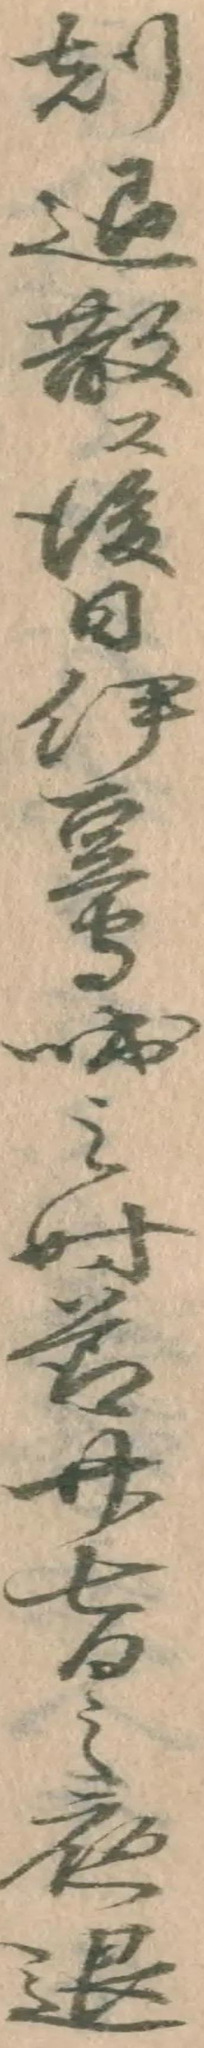刻退散す後日伊豆守咄之時節廿七日之夜退
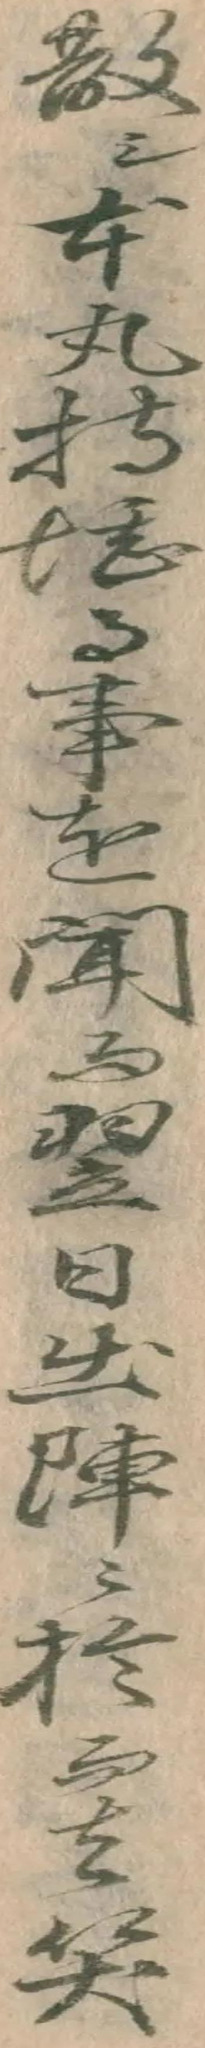散し本丸持堪る事を聞而翌日出陣に於而者笑
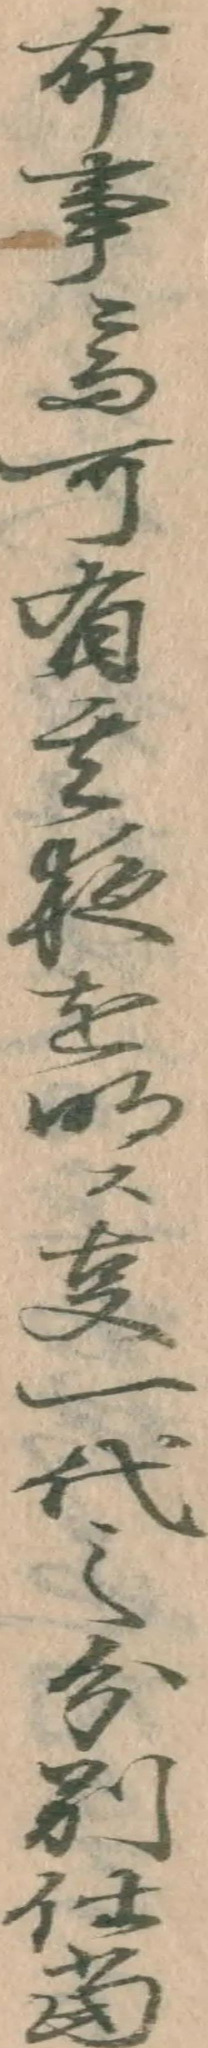布事に而可有其夜を明す事一代之分別仕当
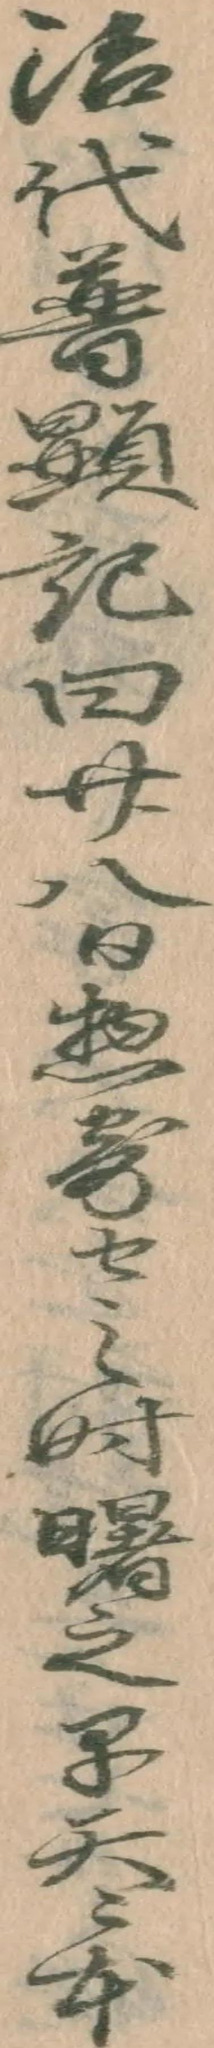治代普顕記曰廿八日惣寄せ之時曙之早天に本
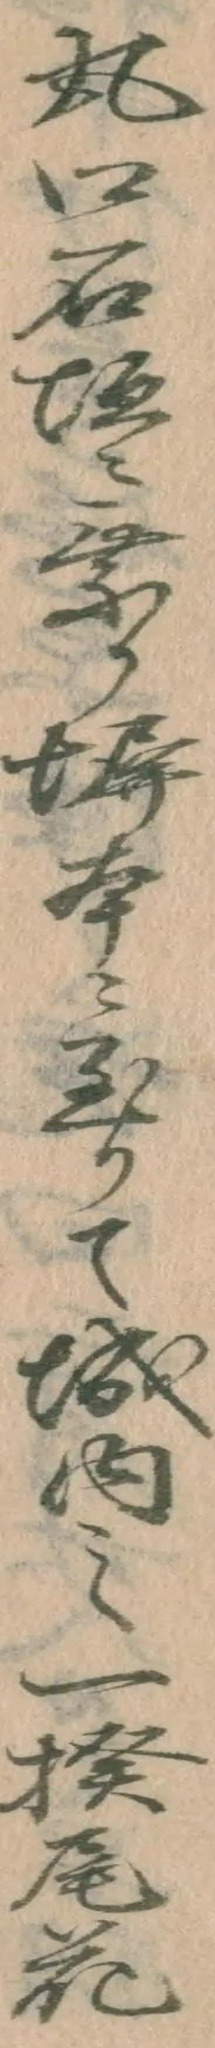丸口石垣に乗り塀本に至りて城内之一揆尾花
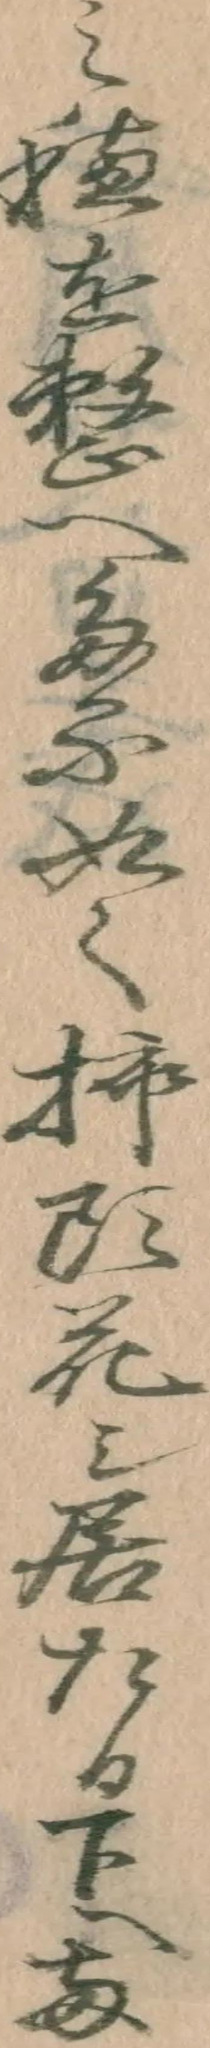之穂を整へ多累如く掃頭花し居たる下へ両
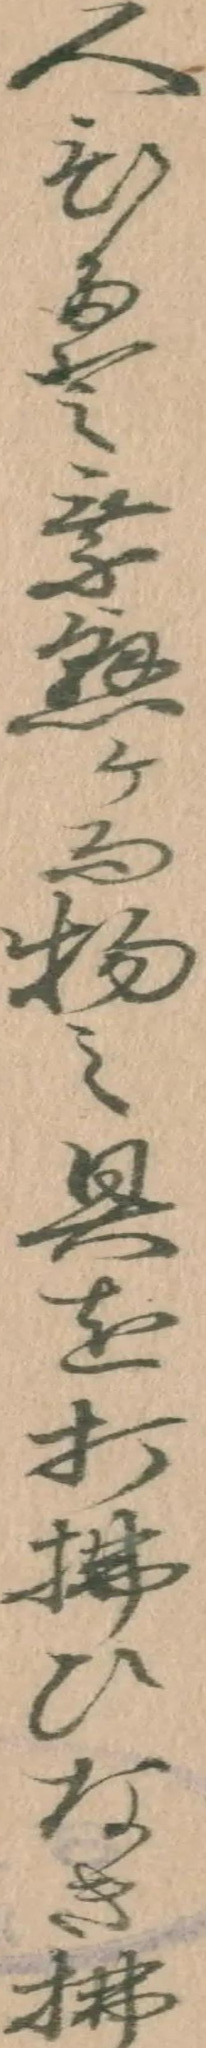人飛多登乗懸け而物之具を打払ひなき払
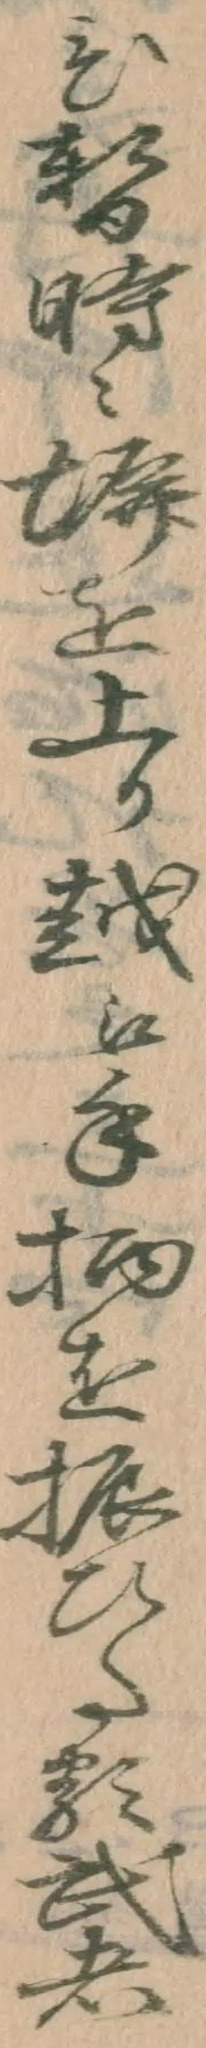飛勢時に塀を上り越江手柄を振ひた類武者
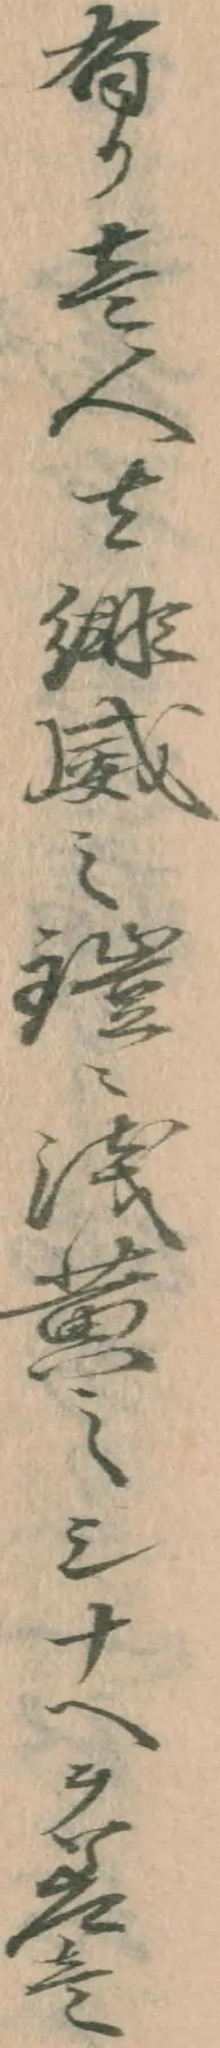有り壱人者緋威之鎧に浅黄之しなへを差壱
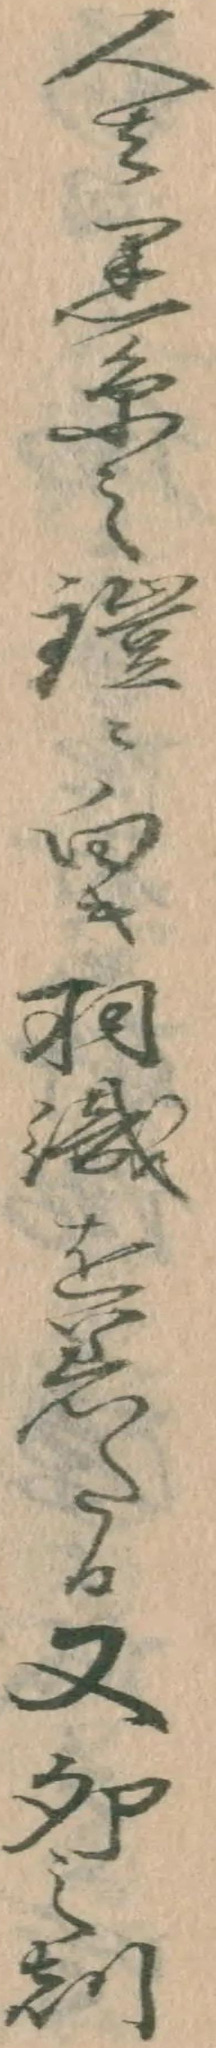人者黒糸之鎧に白き羽織を着たる又夘之刻
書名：切支丹御退治記 49巻. [8]
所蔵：国立国会図書館 National Diet Library, JAPAN
